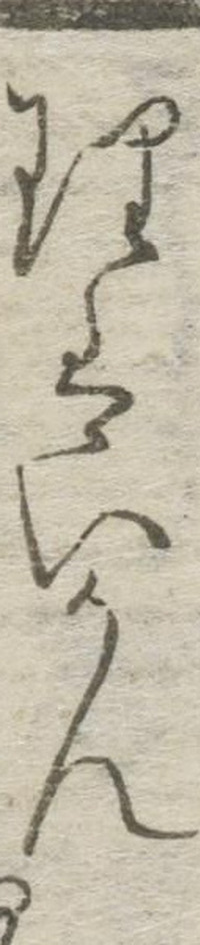理はいかん
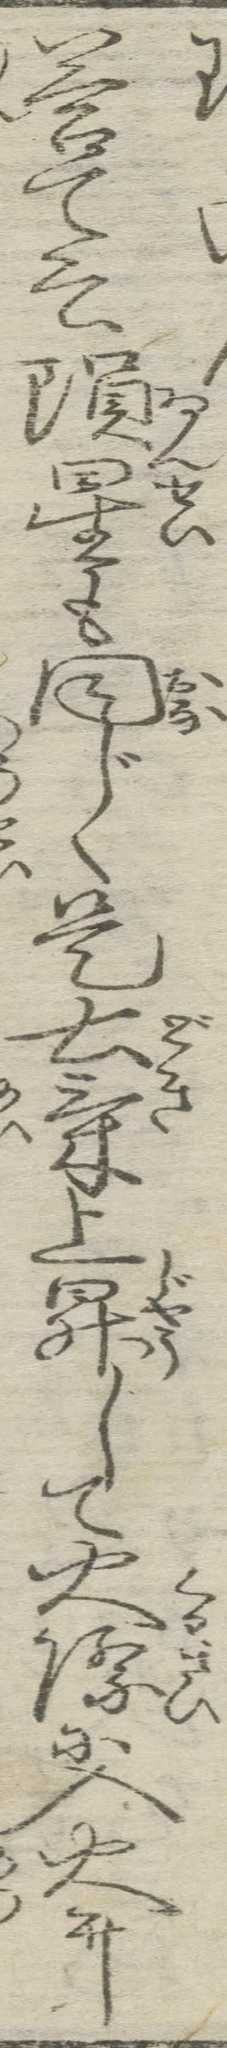答て云隕星も同じく是土気上昇して火際に入火に
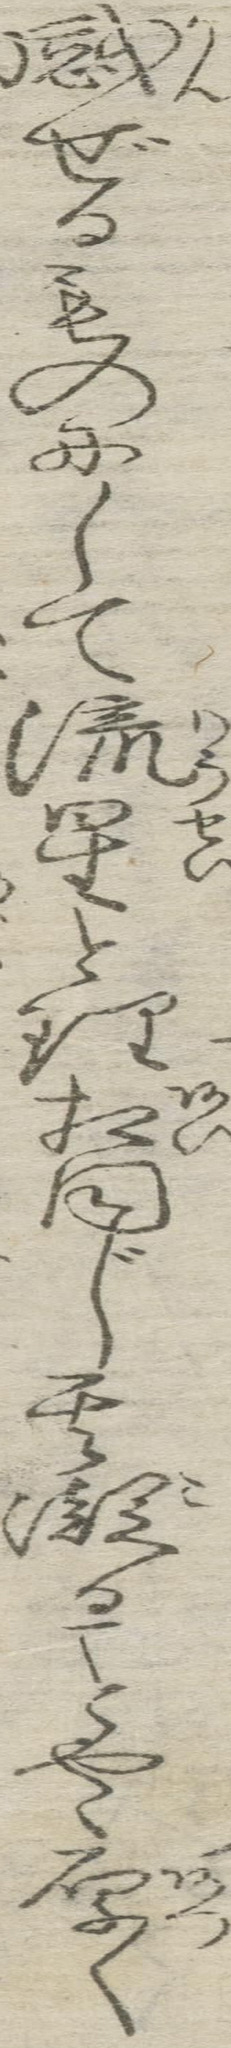感ぜるものにして流星と理相同じ其凝ることやゝ厚く
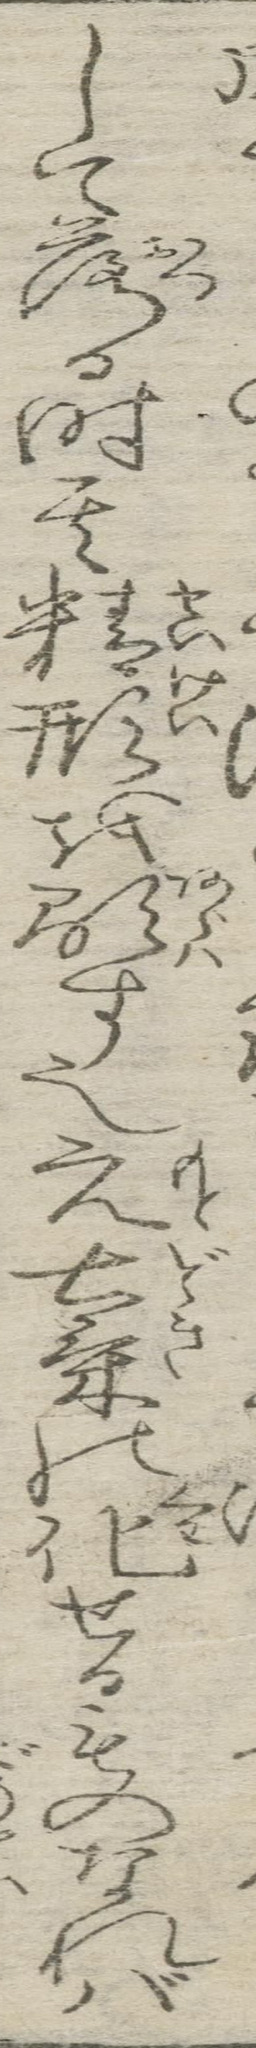して落る時其精形を顕す也元土気の化せるものなれば
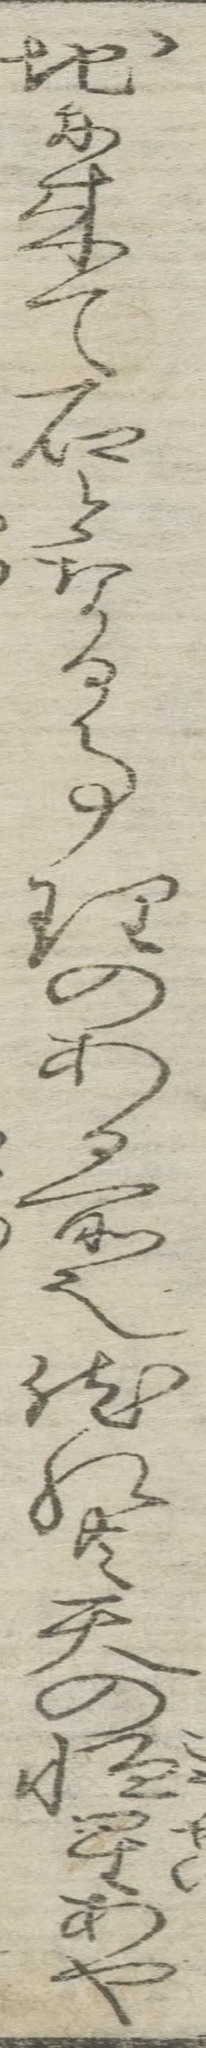地に来て石となる事理のある所也然れ共天の恒星あや
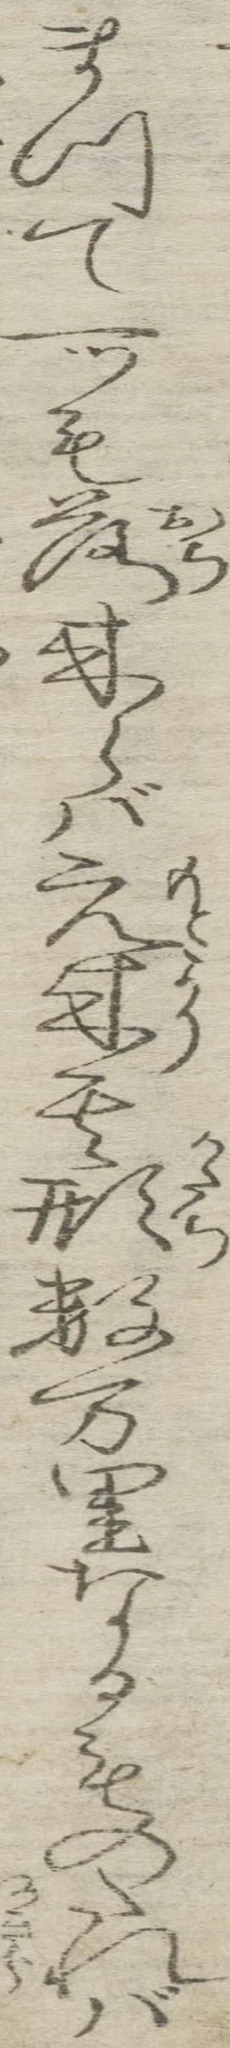まつて一ッも落来らば元来其形数万里なるものたれば
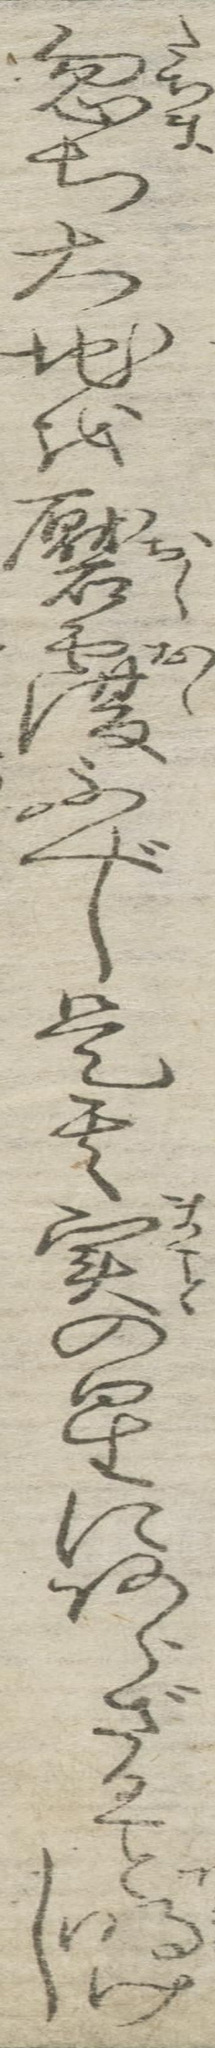忽ち大地を圧覆ふべし是其実の星にあらざること明けし
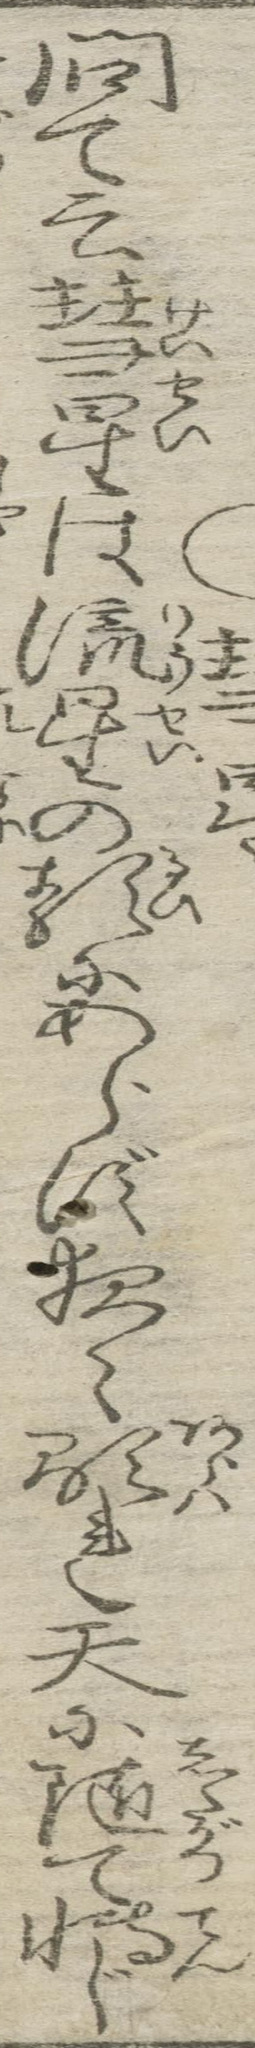問て云彗星は流星の類にあらず夜〻顕れ天に随て転じ
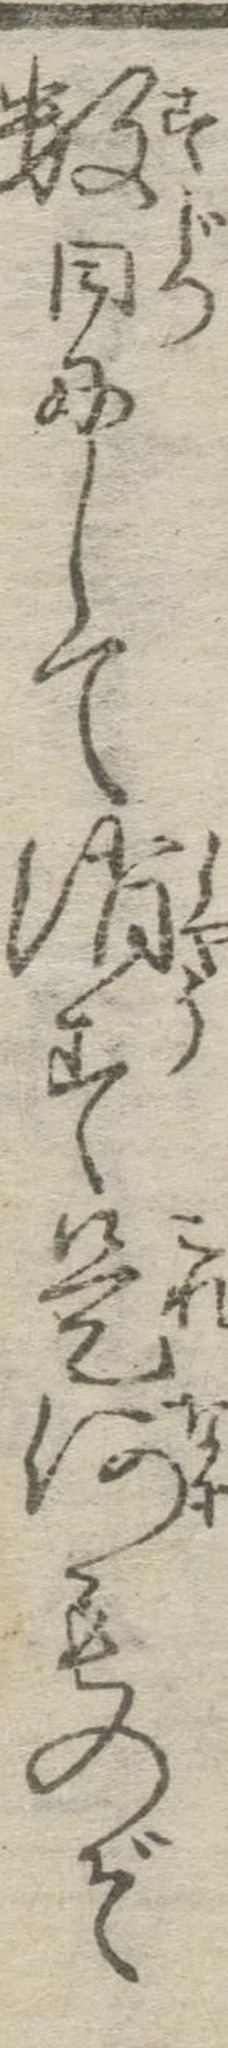数日にして消す是何ものぞ

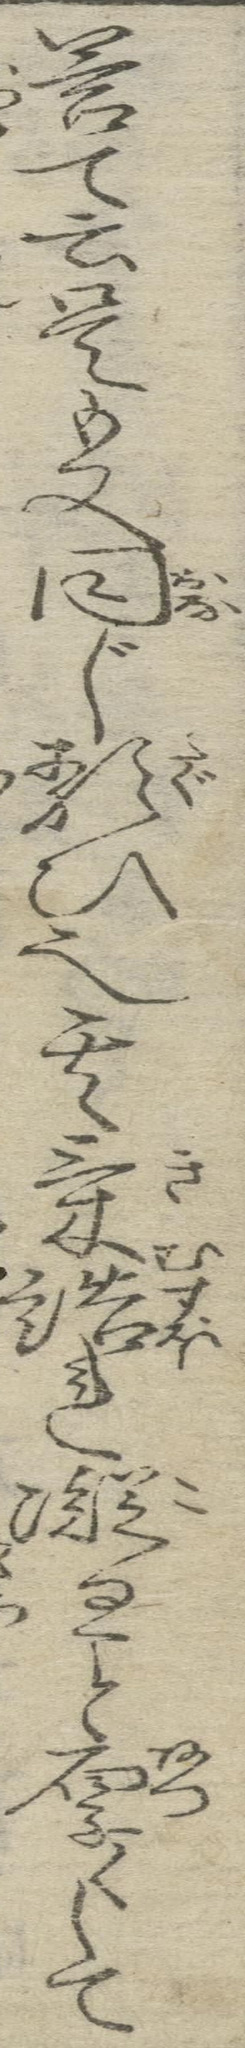答て云是も又同じ類ひ也其気結れ凝ること厚くして
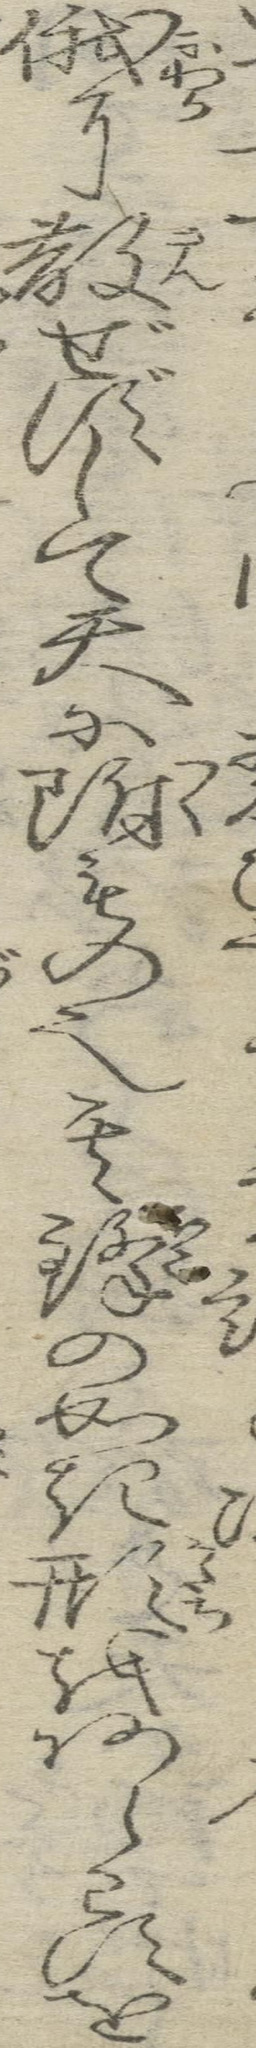俄に散ぜずして天に附もの也其鋒の如き形をあらわすを
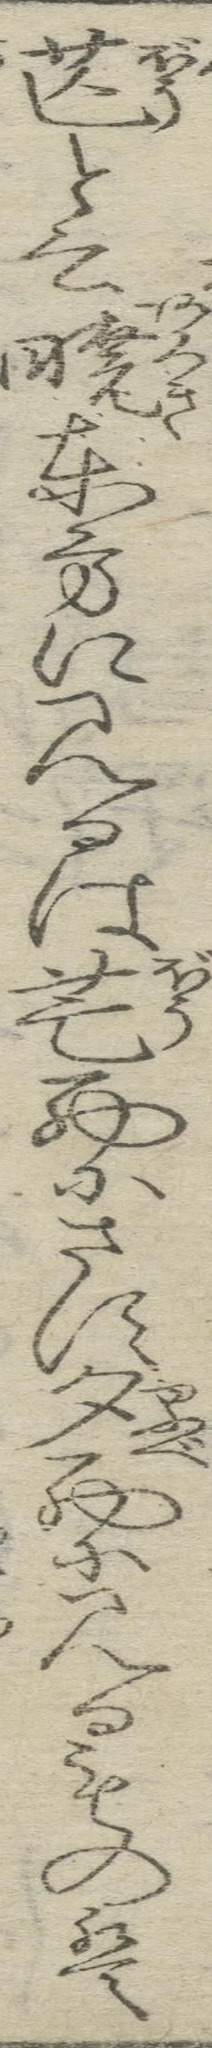芒と云暁東方に見るは芒西にさす夕西に見るものは
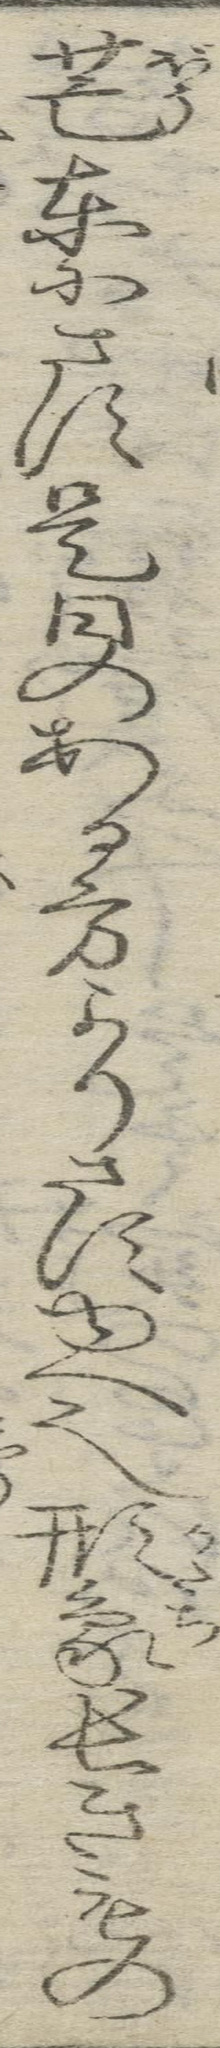芒東にさす是日のある方よりさすゆへ也形象長きもの
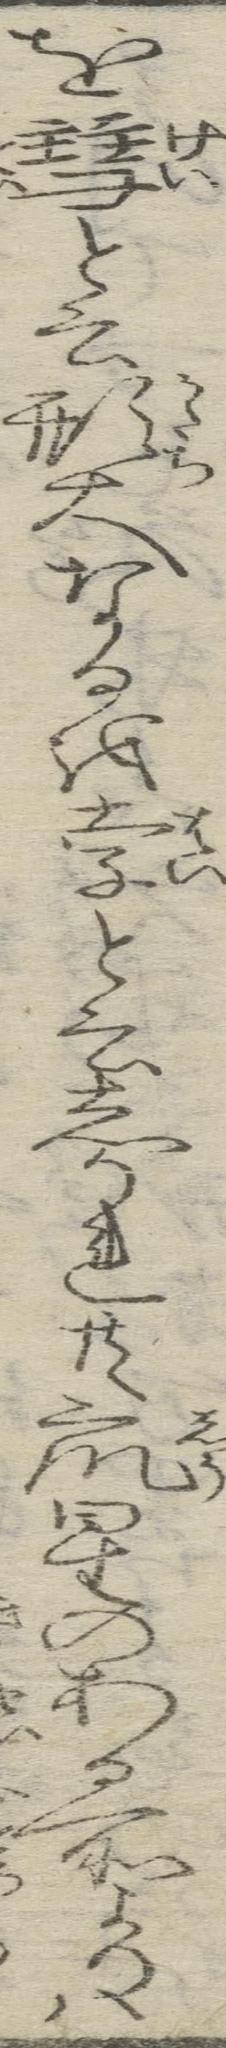を彗と云形大なるを孛と云しかれ共衆星のある所よりは
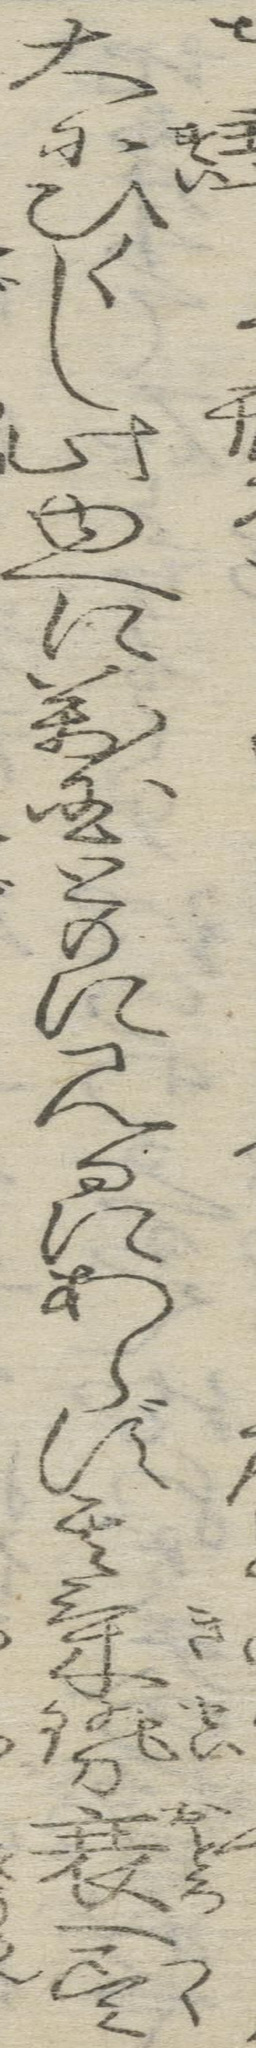大にひくし此ゆへに万国ともに見るにあらず其気勢衰へ尽
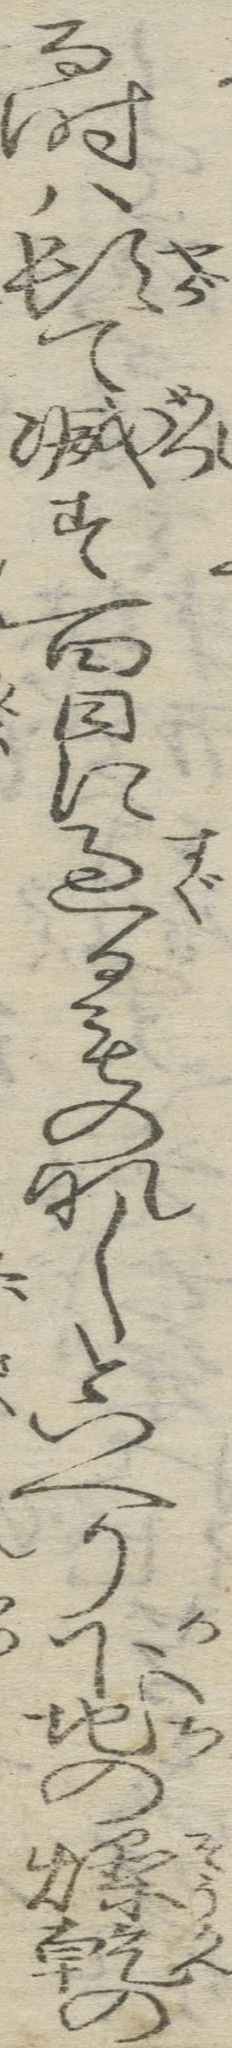る時は頓て滅す百日に過るものなしといへり下地の燥乾の
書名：訓蒙天地辨　天
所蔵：東京大学地震研究所図書室 Earthquake Research Institute Library, The University of Tokyo, JAPAN
